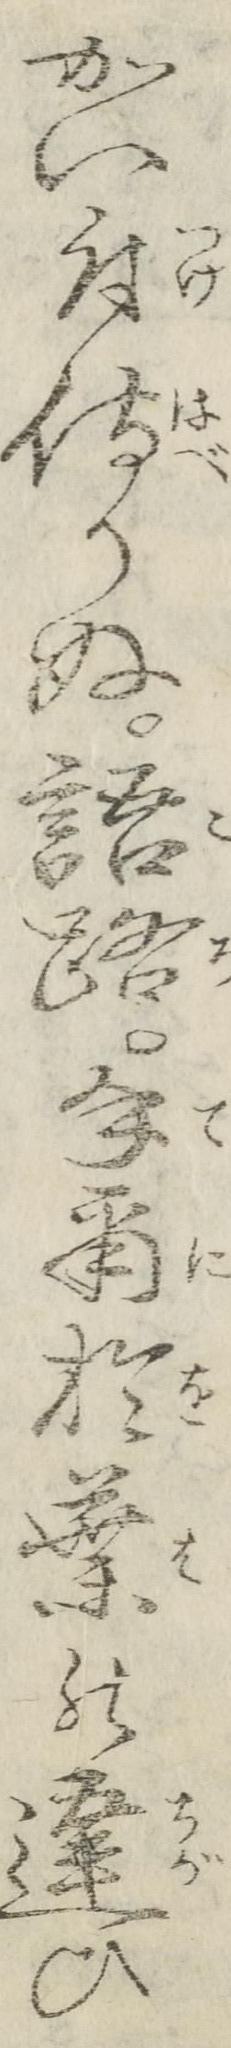かい付侍りぬ。語路。手爾於葉の違ひ
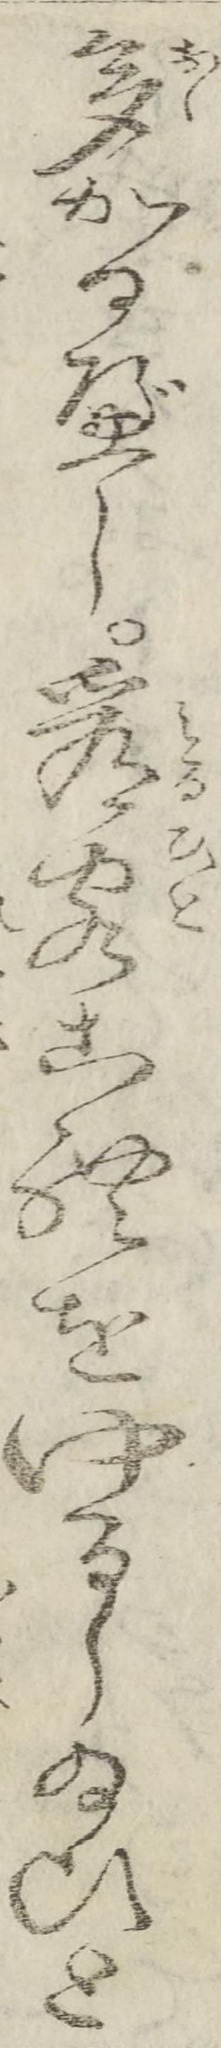多かるべし。爰家？これをゆるし給ひと
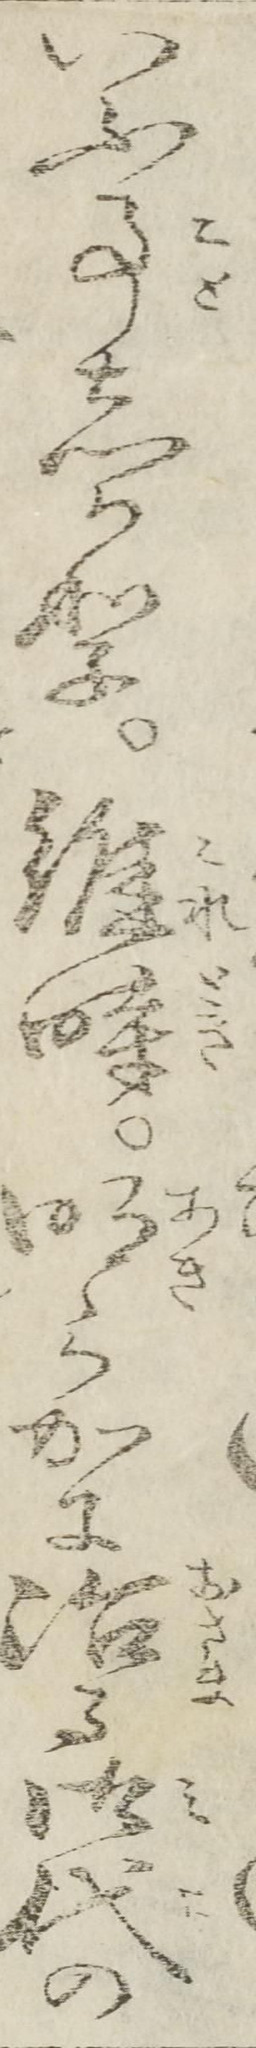いふ事しかり。維時。明らかに治る御代の
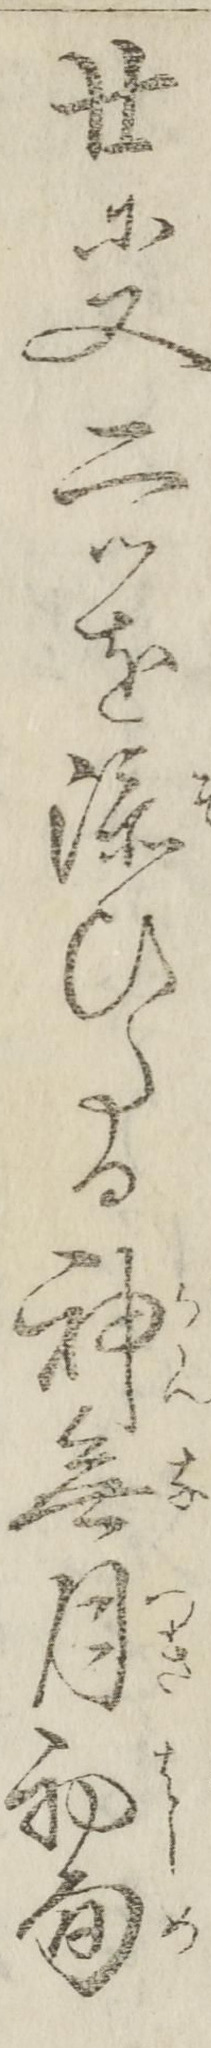廿に又二つを添ひたる神無月初旬
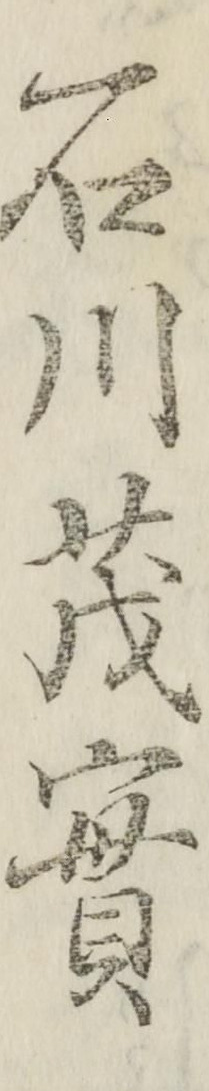石川茂実
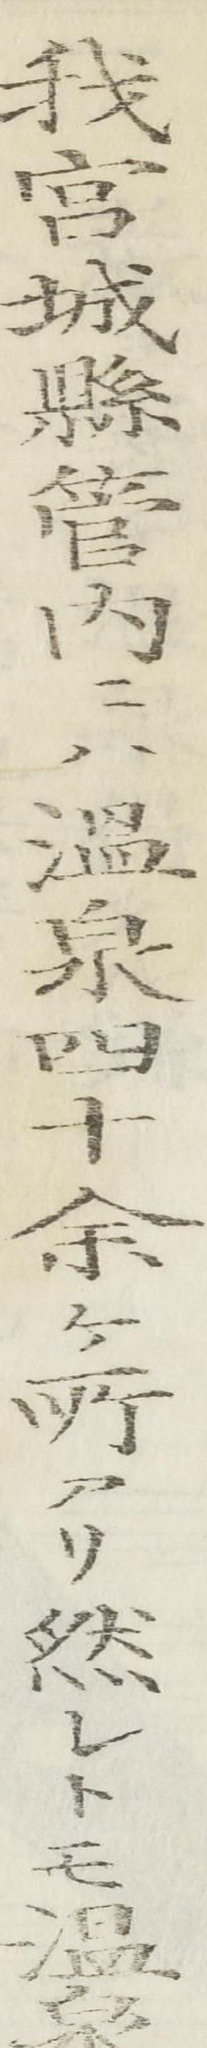我宮城県管内ニハ温泉四十余ケ所アリ然レトモ温泉
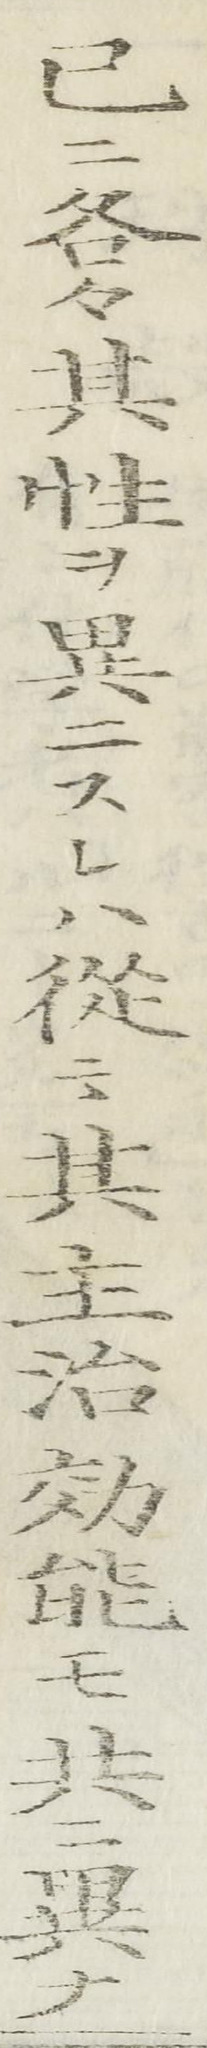已ニ各々其性ヲ異ニスレハ従テ其主治効能モ共ニ異ナ
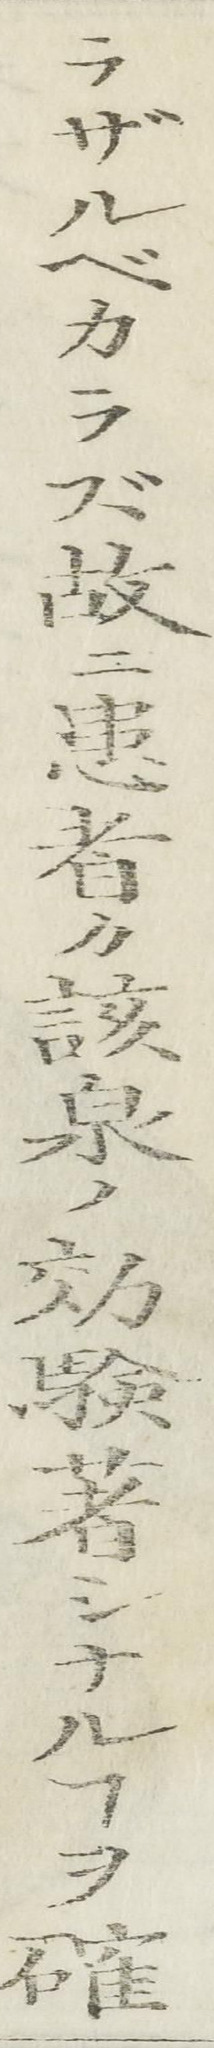ラザルベカラズ故ニ患者ガ該泉ノ効験著シタルヿヲ確
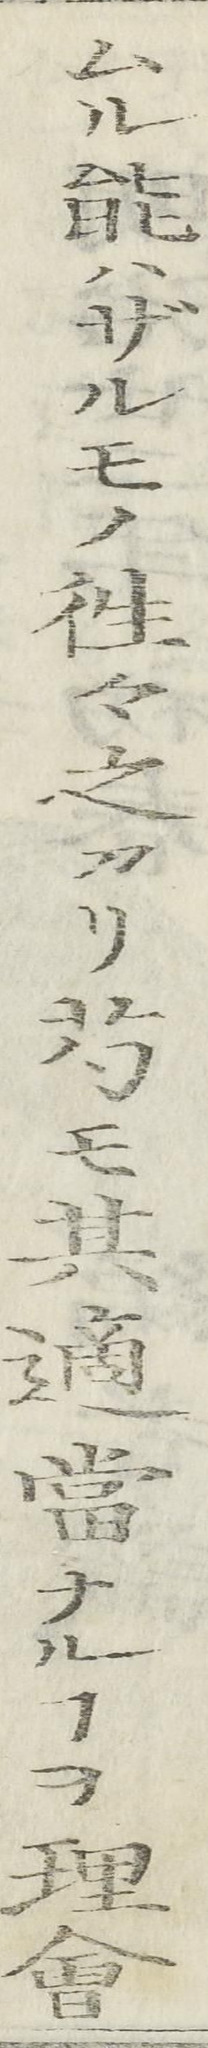ムル能ハザルモノ往々之カリ芍モ其適当ナルヿヲ理会
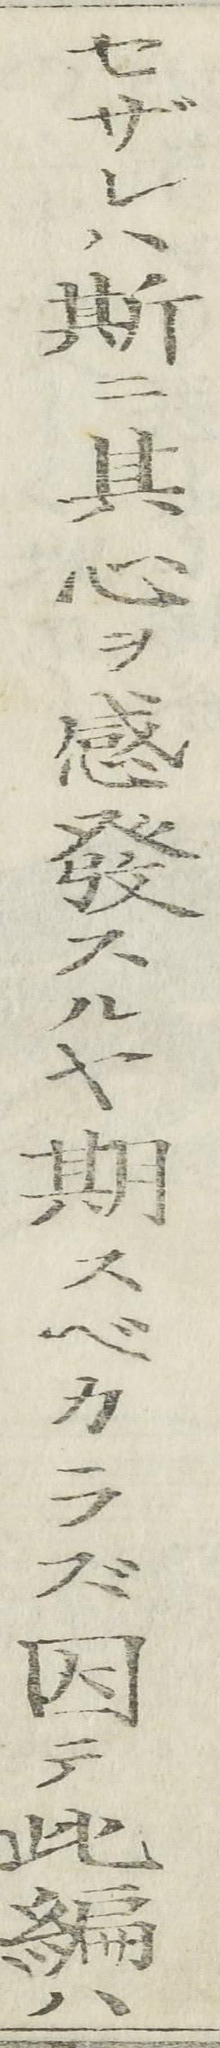セザレハ斯ニ其心ヲ感発スルヤ期スベカラズ因テ此編ハ
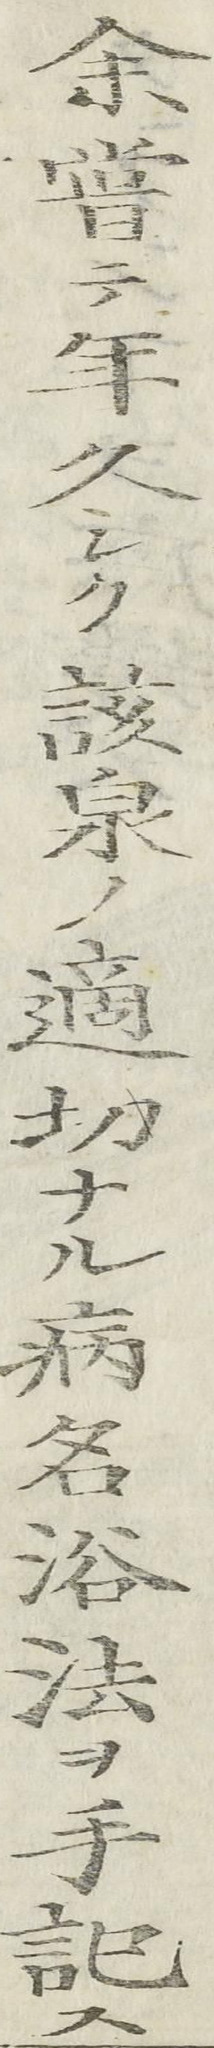余嘗テ年久シク該泉ノ適切ナル病名浴法ヲ手記ス
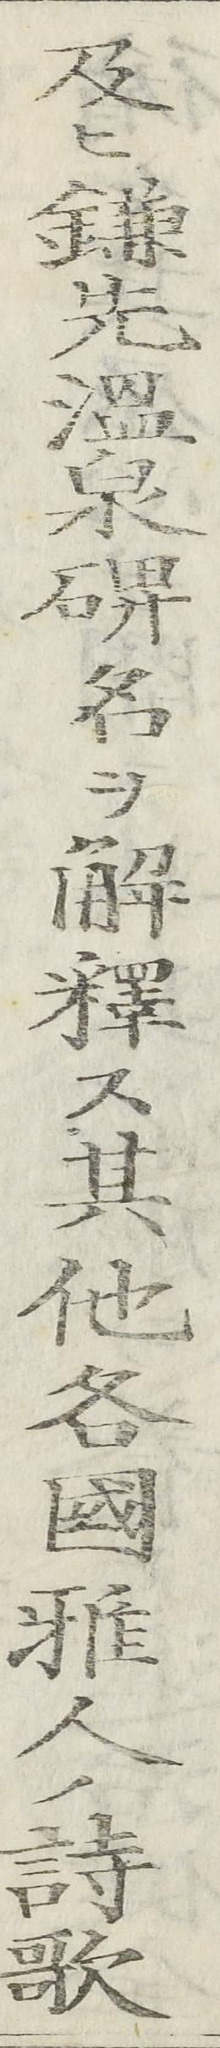及ヒ鎌先温泉碑名ヲ解釈ス其他各国雅人ノ詩歌
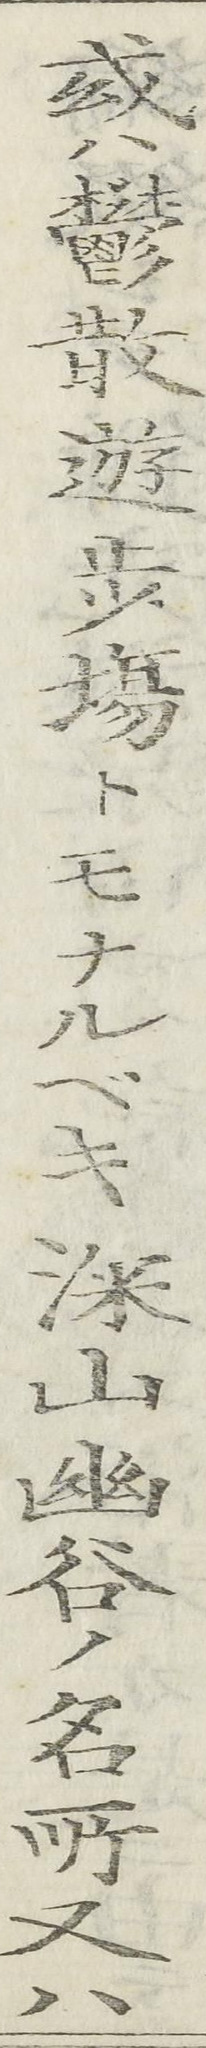或ハ鬱散遊歩場トモナルベキ深山幽谷ノ名所又ハ
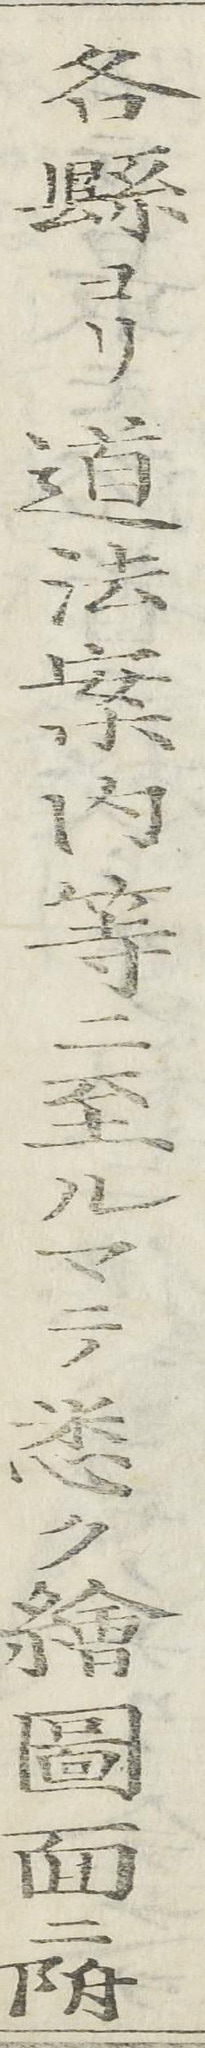各県ヨリ道法案内等ニ至ルマテ悉ク絵図面ニ附

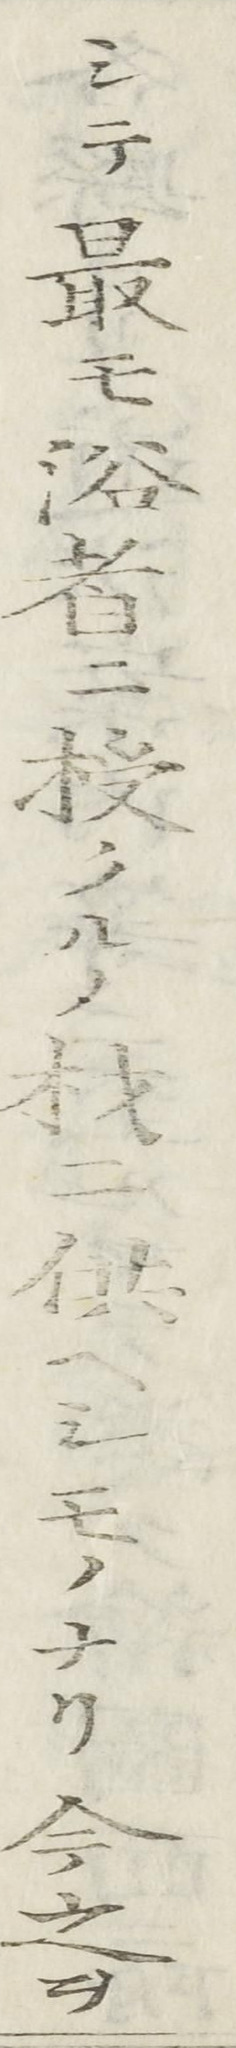シテ最モ浴者ニ授クルノ材ニ供ヘシモノナリ今之ヲ
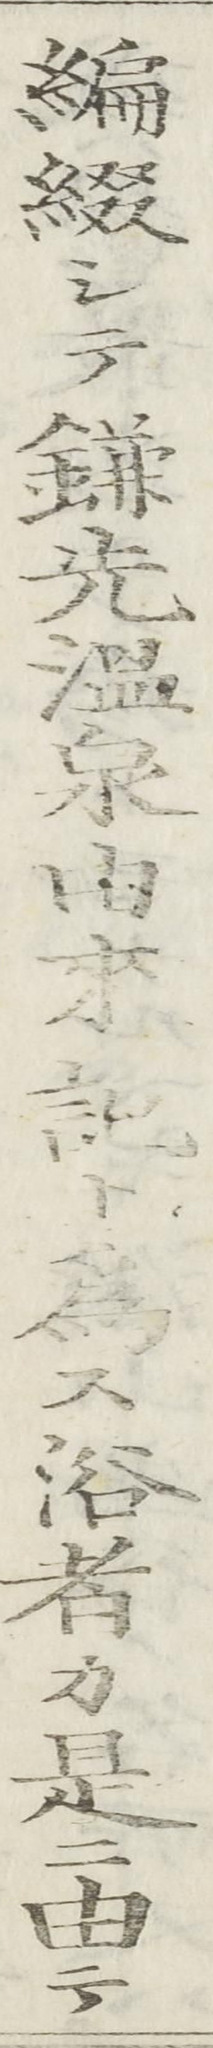編綴シテ鎌先温泉由来記ヲ為ス浴者カ是ニ由テ
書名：鎌先温泉由來記
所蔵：東京大学地震研究所図書室 Earthquake Research Institute Library, The University of Tokyo, JAPAN
